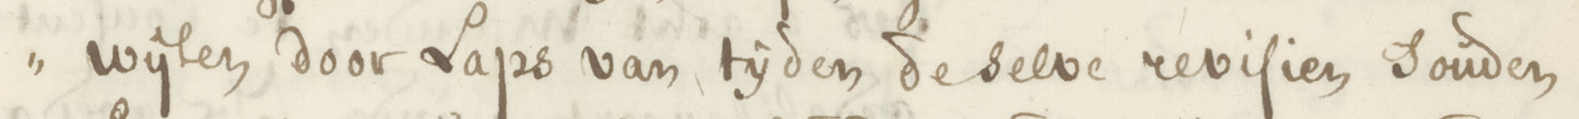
„wijlen door Laps van tijden deselve revisien souden
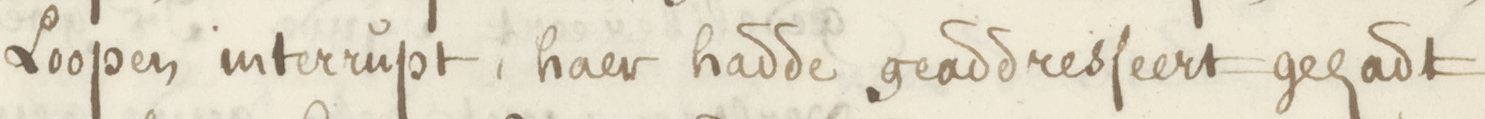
Loopen interrupt, haer hadde geaddresseert gehadt
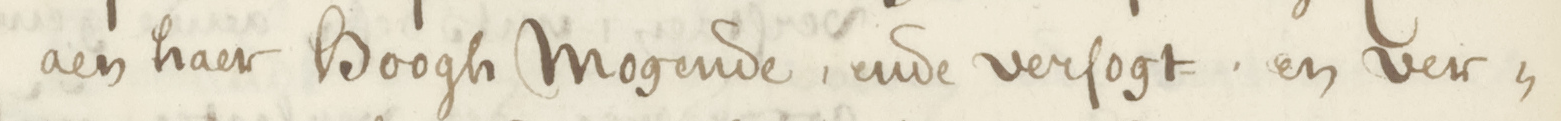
aen haer Hoogh Mogende, ende versogt, en ver„
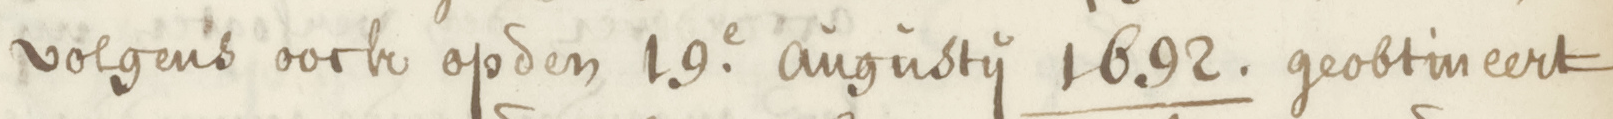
„volgens oock opden 19e. Augustij 1692. geobtineert
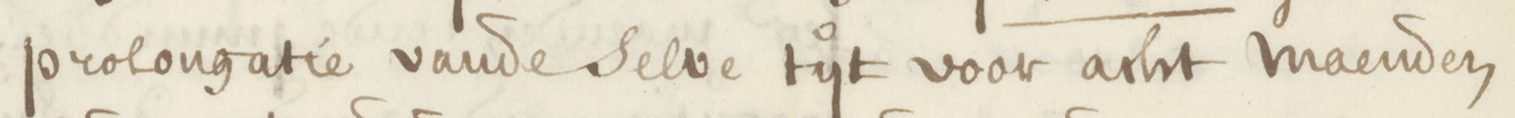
prolongatie vande selve tijt voor acht Maenden
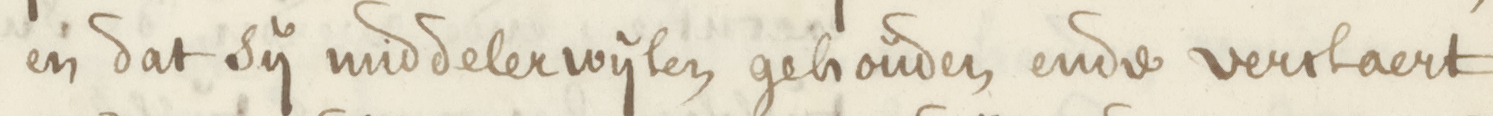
en dat sij middelerwijlen gehouden ende verclaert
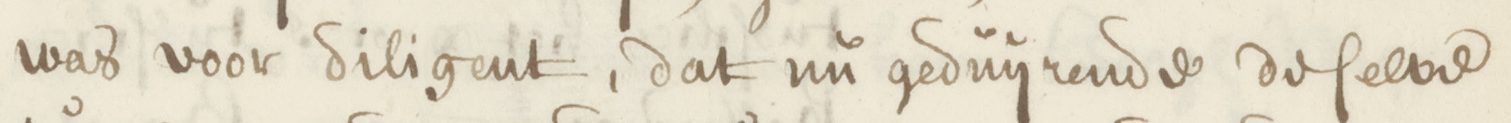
was voor diligent, dat nu geduijrende deselve
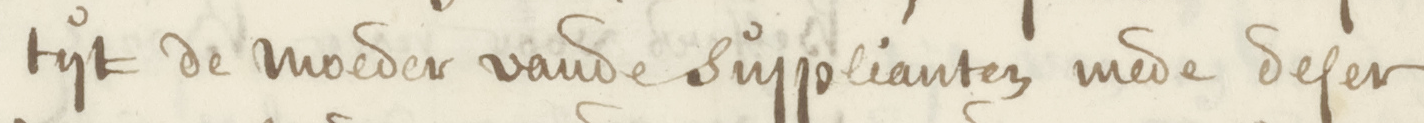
tijt de moeder vande supplianten mede deser
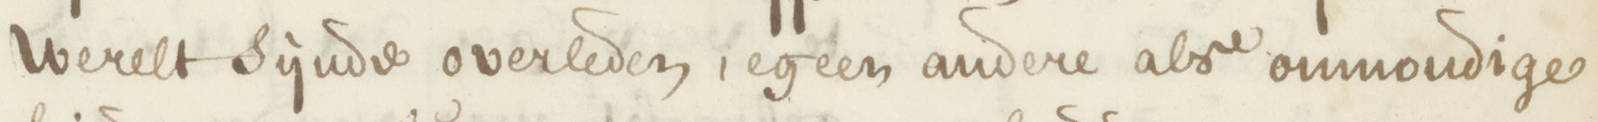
werelt sijnde overleden, egeen andere als onmondige
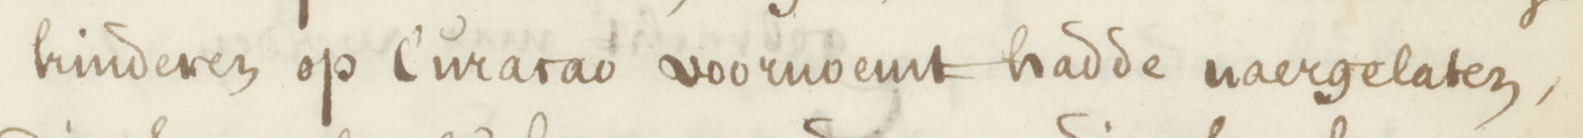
kinderen op Curacao voornoemt hadde naergelaten,
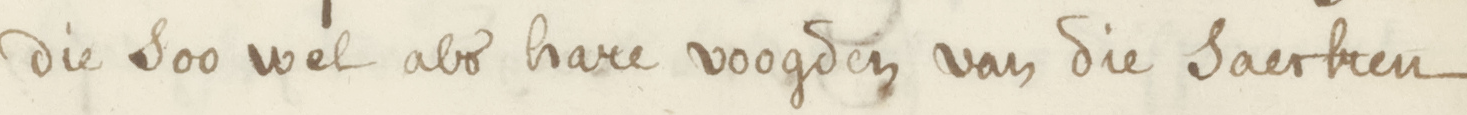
die soo wel als hare voogden van die saecken
